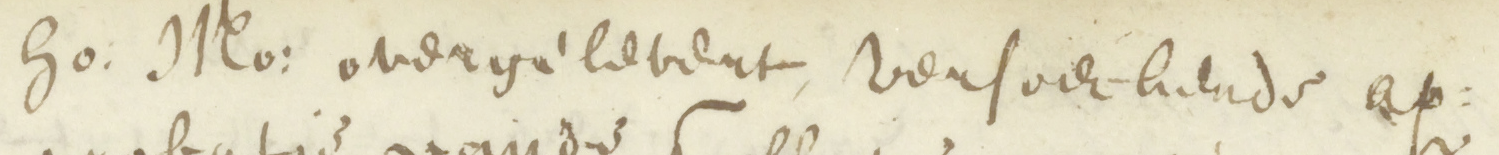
ho:Mo: overgelevert, versoeckende ap„
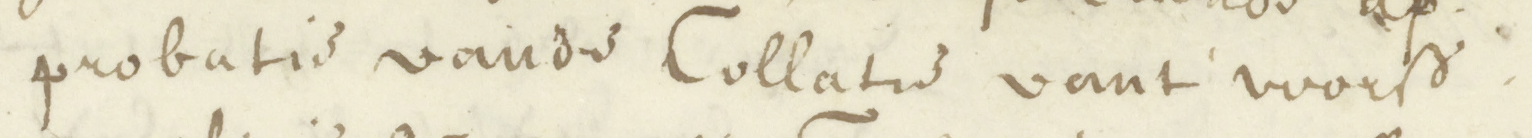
probatie vande Collatie vant‛ voors
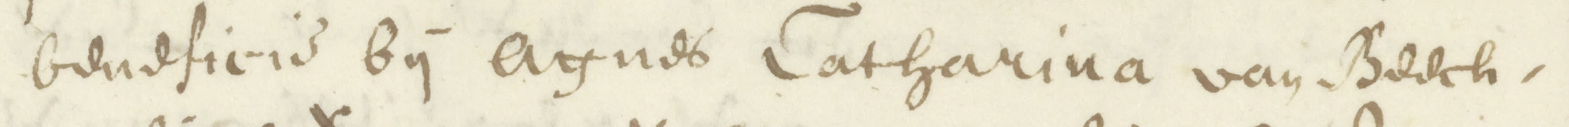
beneficie bij Agnes Catharina van Beeck,
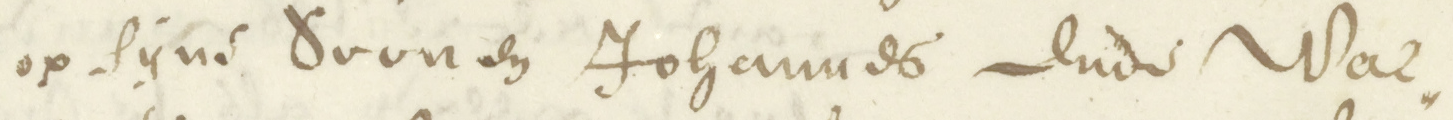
op sijne Soonen Johannes ende Wal„
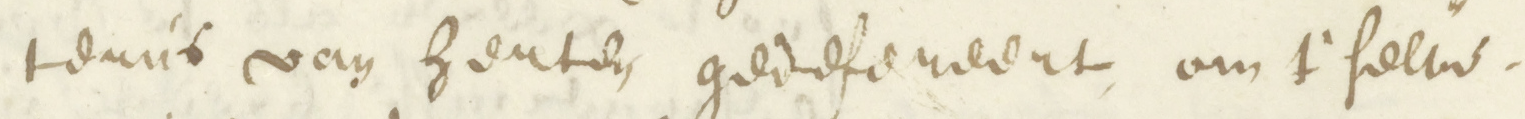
terus van herten gedefereert om t‛selve
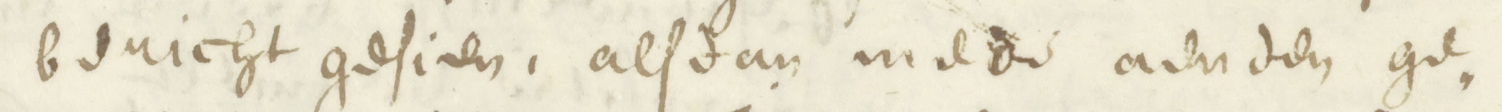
bericht gesien, alsdan mede aenden ge„
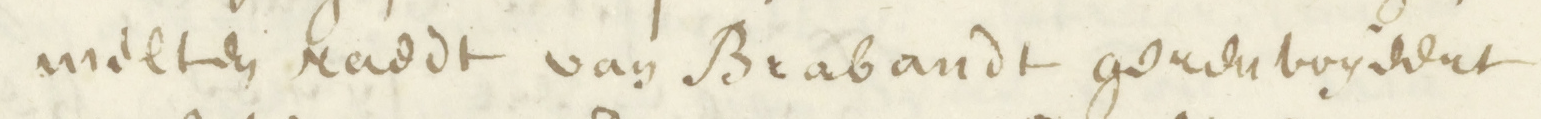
melten raedt van Brabandt gerenvoijeert
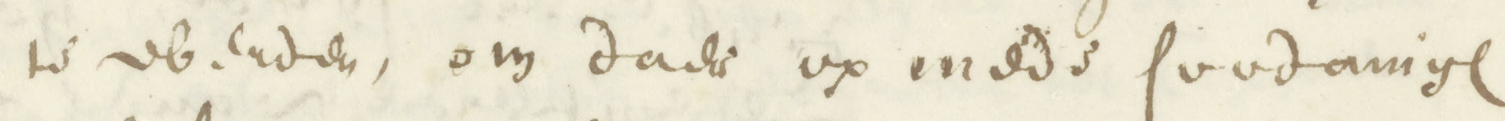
te werden, om daer op mede soodanigh
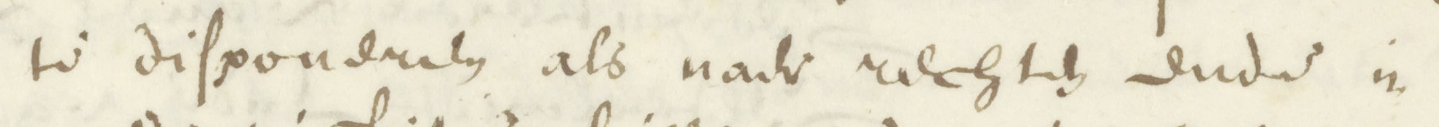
te disponeren als naer rechten ende in
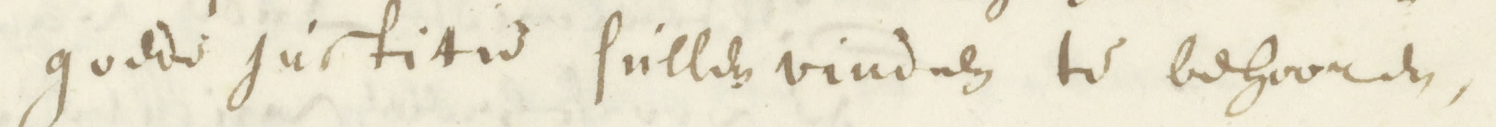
goede justitie sullen vinden te behooren.
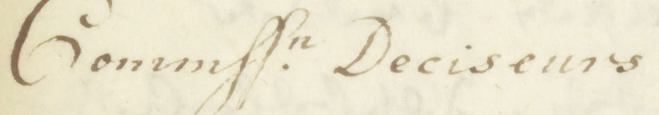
Commissn. Deciseurs
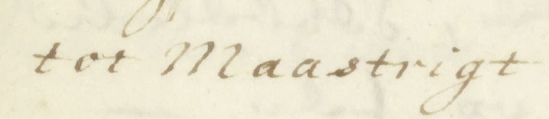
tot Maastrigt
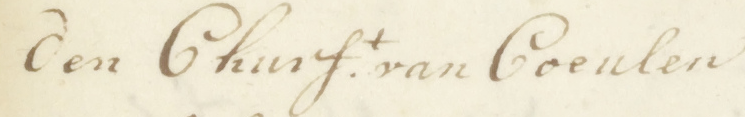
den Churft. van Coeulen
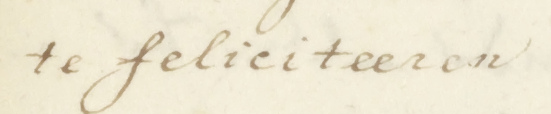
te feliciteren
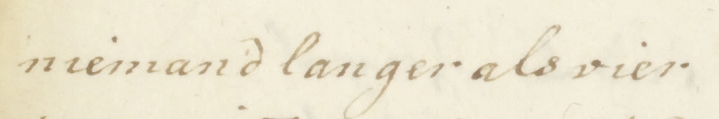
niemand langer als vier
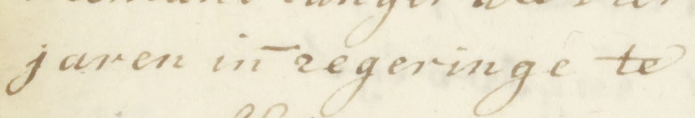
jaren in regeringe te
